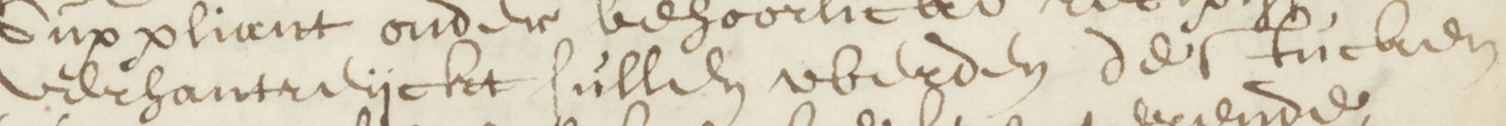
verhantreijckt sullen werden de stucken
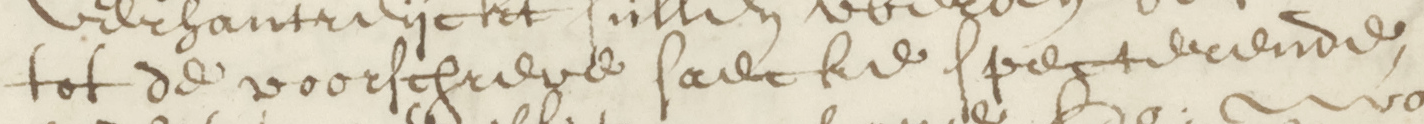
tot de voorschreve saecke specterende,
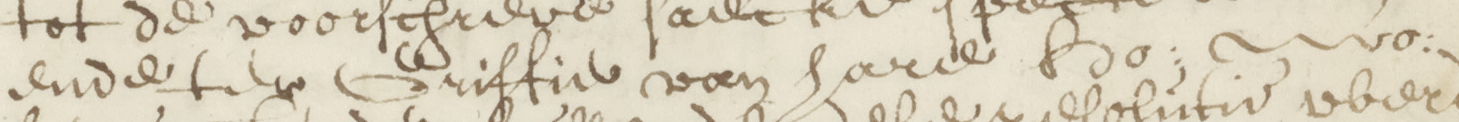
ende ter Griffie van hare ho:Mo:
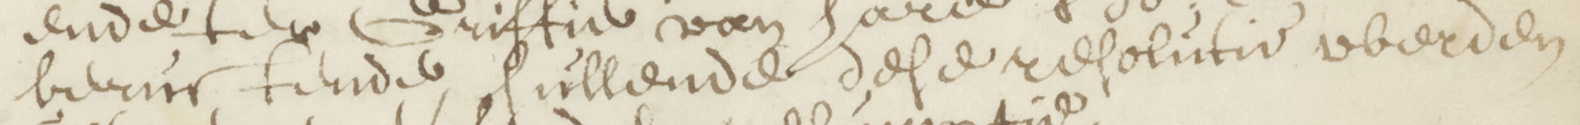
berustende sullende dese resolutie werden
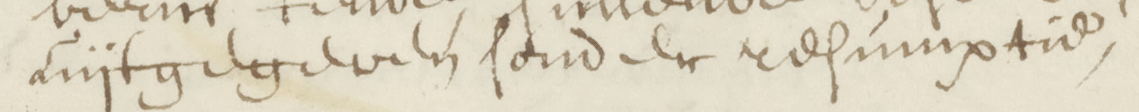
uijtgegeven sonder resumptie.
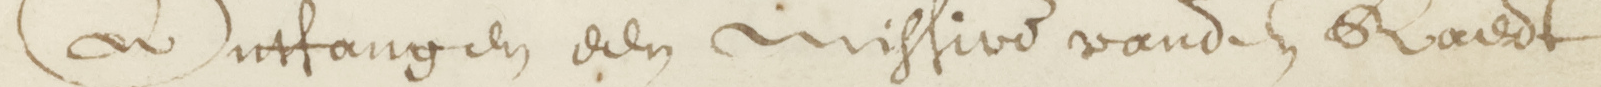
Ontfangen een missive vanden Raedt
